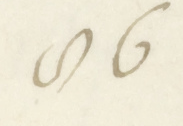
86
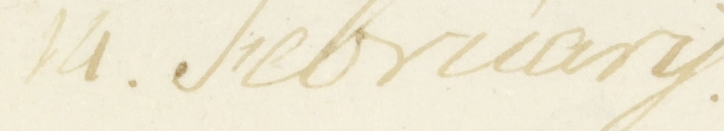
14. Februarij
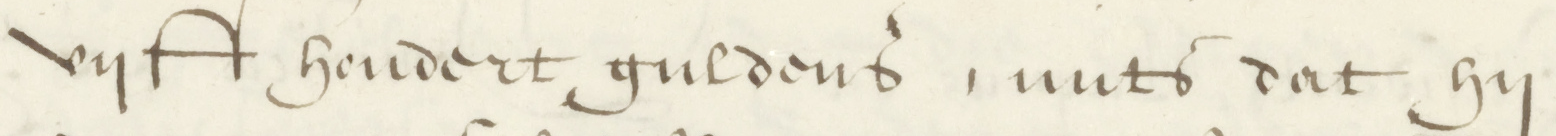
vyff hondert guldens, mits dat hy
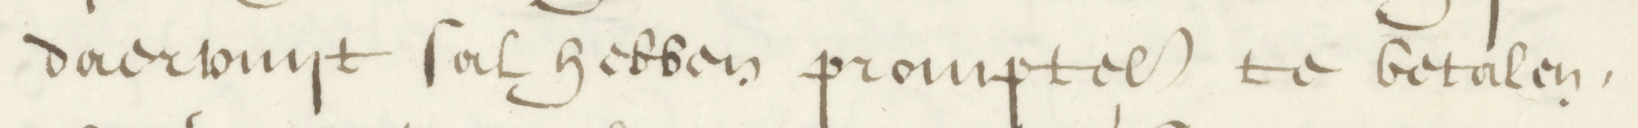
daervuyt sal hebben promptel te betalen,
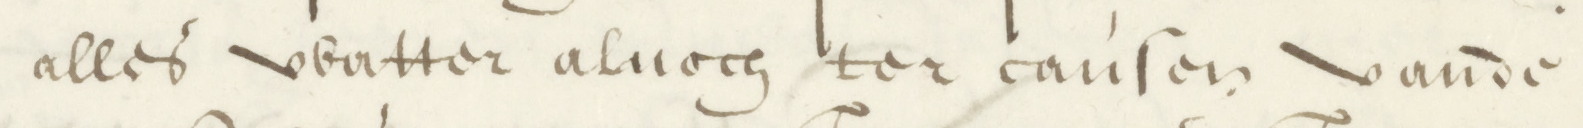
alles watter alnoch ter causen vande
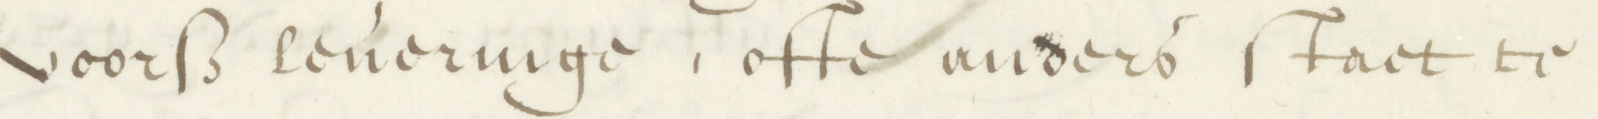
voors leueringe, ofte anders staet te
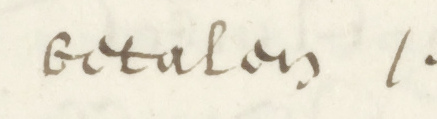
betalen.
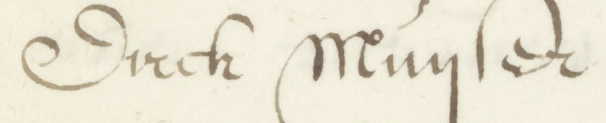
Dirck Muyser
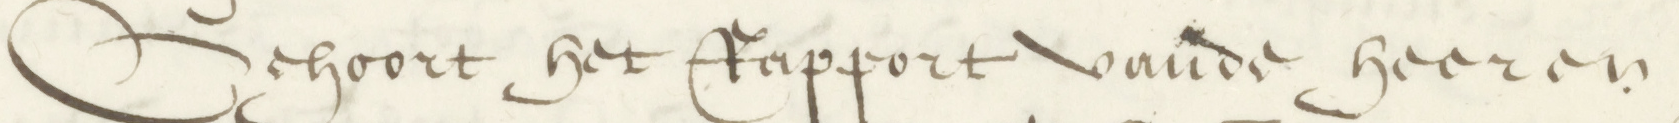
Gehoort het Rapport vande heeren
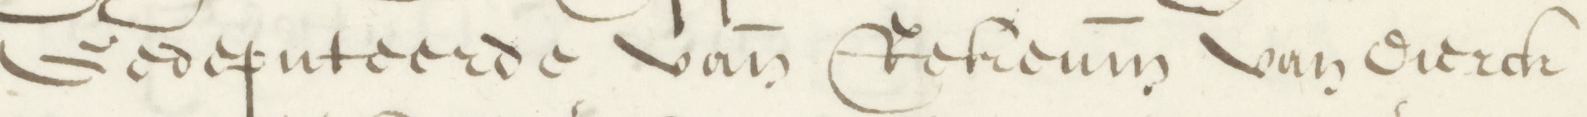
Gedeputeerde van Rekenin van Dierck
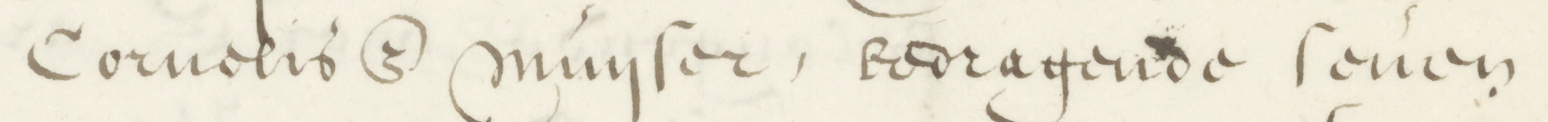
Cornelisz Muyser, bedragende seuen
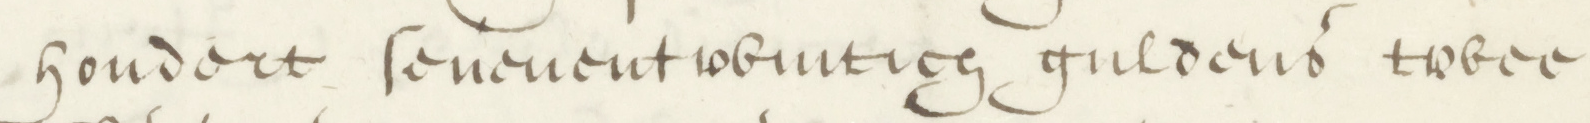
hondert seuenentwintich guldens twee
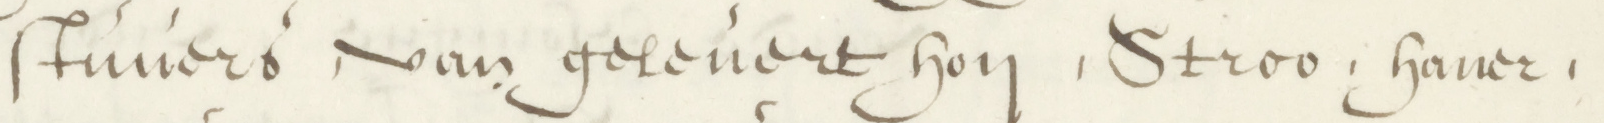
stuuers, van geleuert hoy, Stroo, hauer,
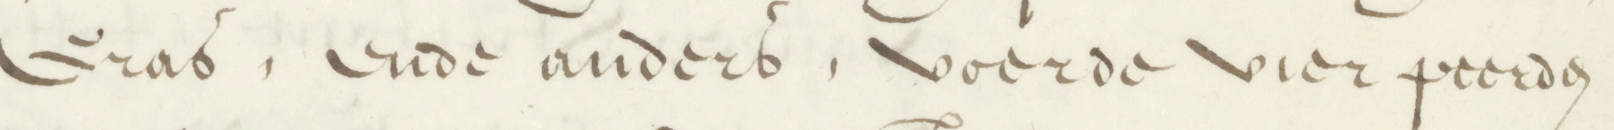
Gras, ende anders, voerde vier peerden
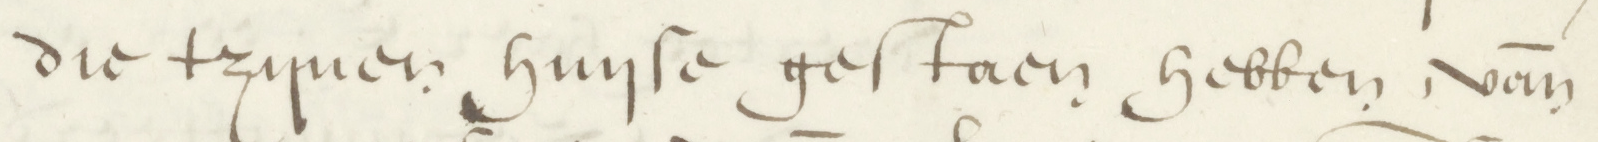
die tzynen huyse gestaen hebben, van
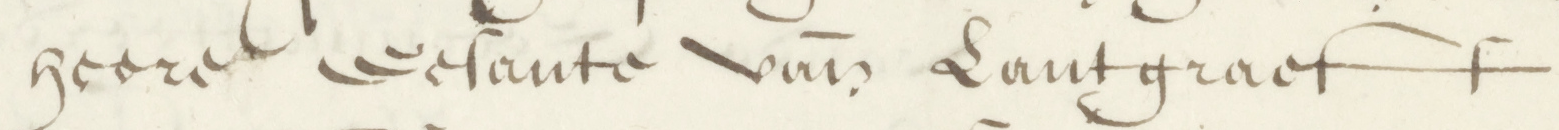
heere Gesante van Lantgraeff
